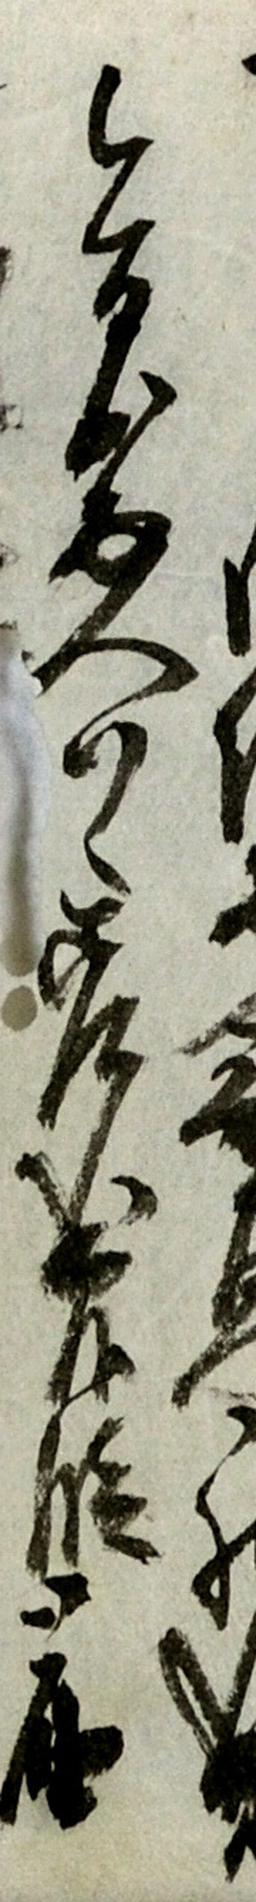今日ゟ両人御差出候段御届
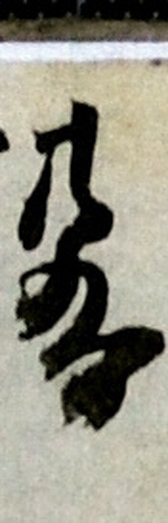廿九日
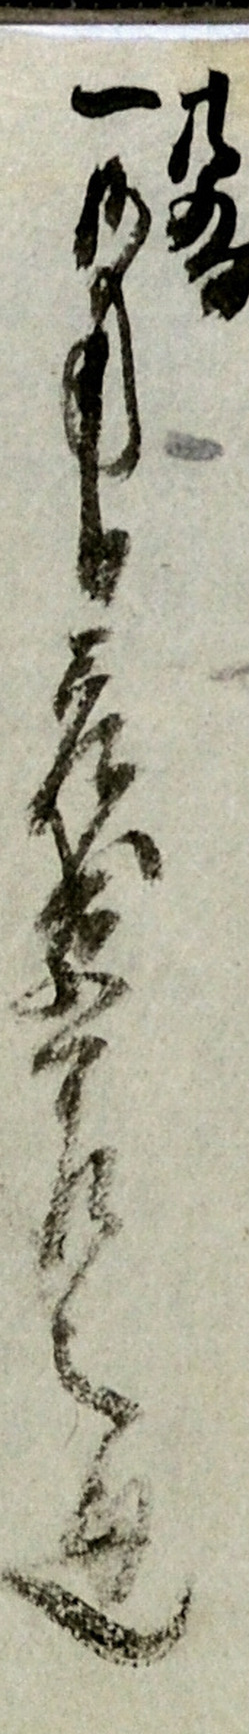一御用日差出書左之通
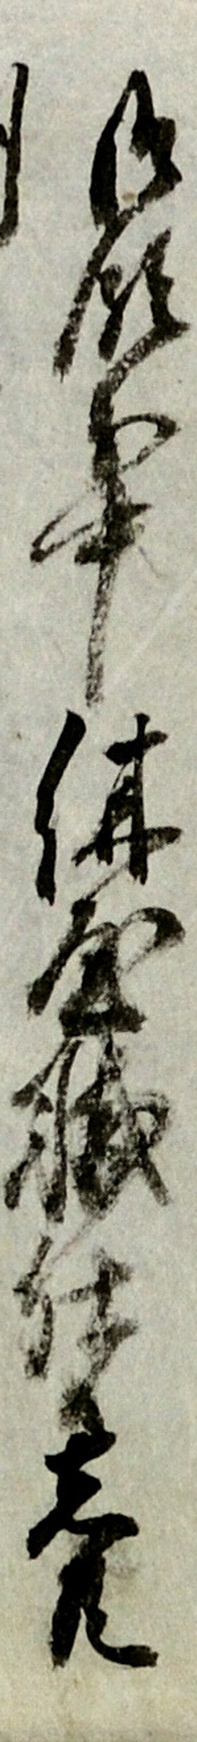御領分中紺屋職仕候者共
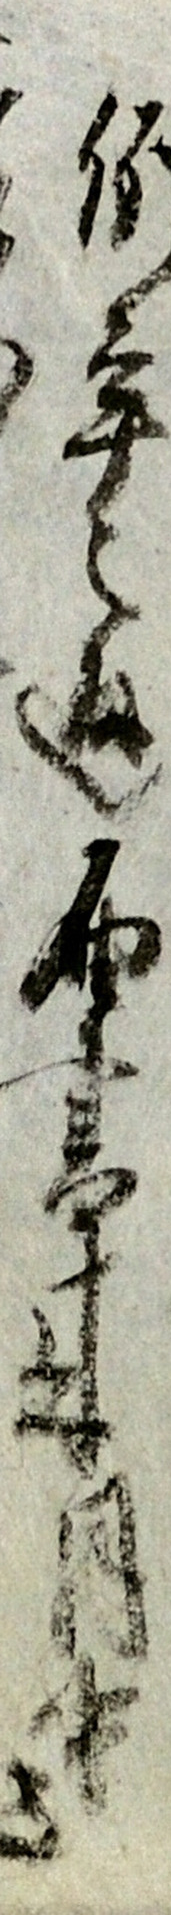例年之通届書来月中迄
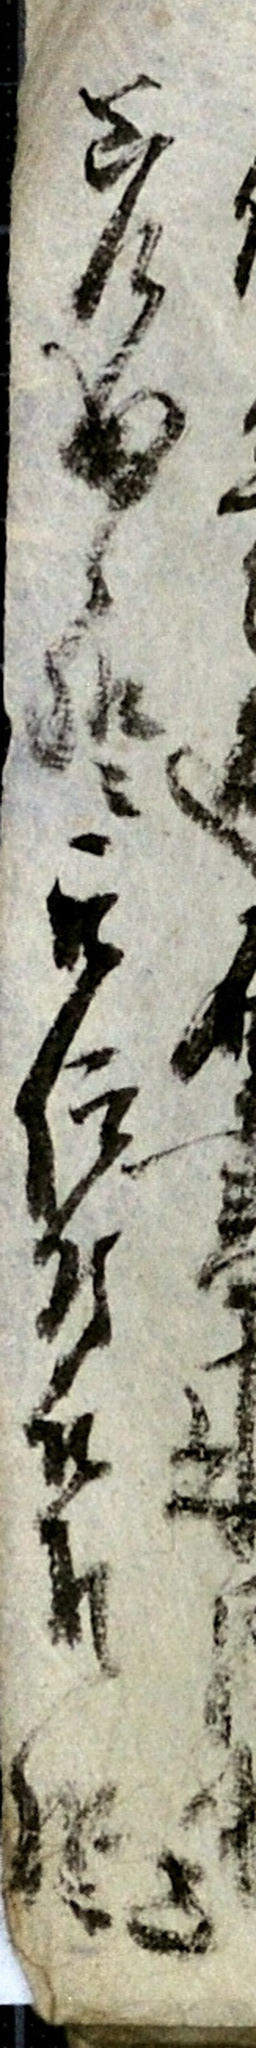差出候様ニ被仰付候下候様ニ

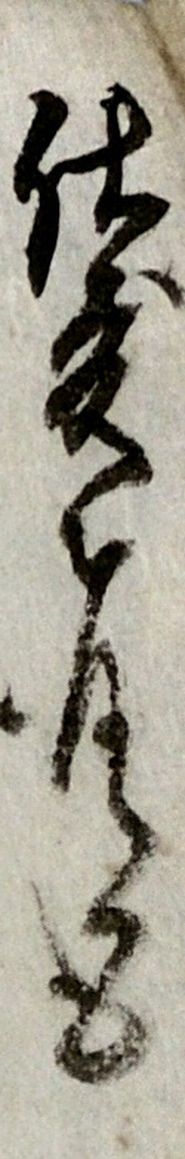仕度奉存候以上
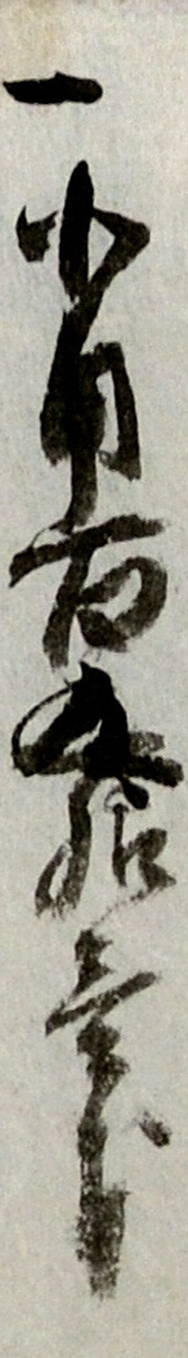一小角百九拾壱本
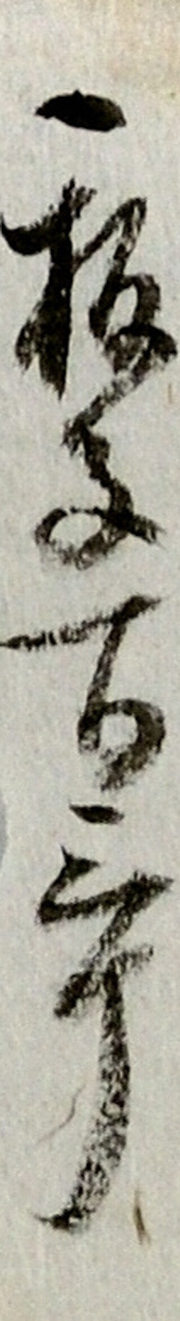一板子百三丁
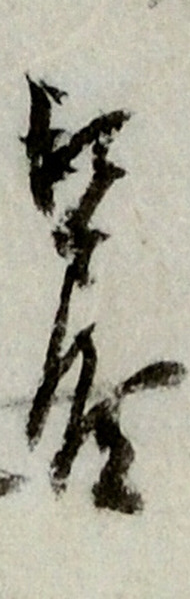江戸屋
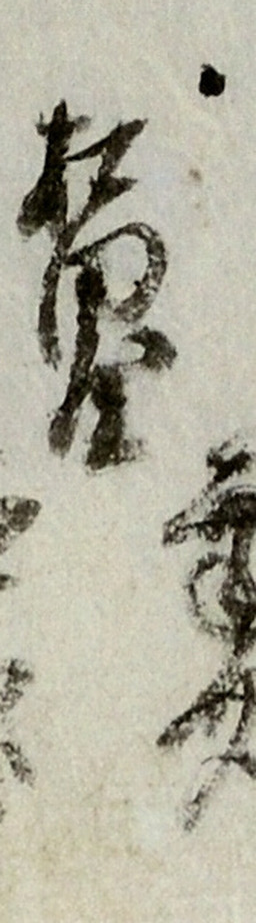松田屋
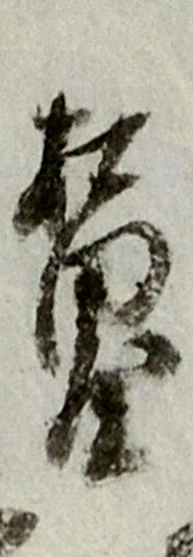松田屋
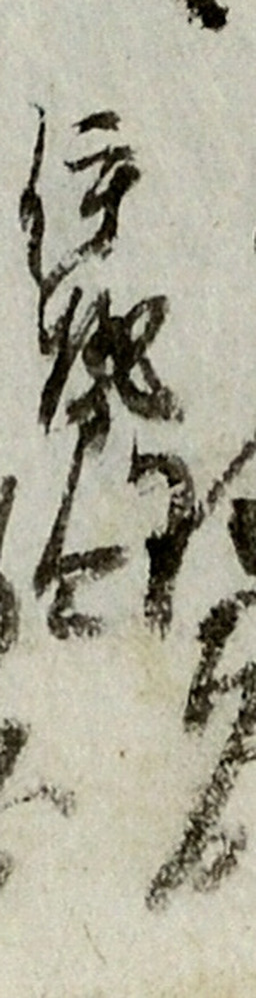伊勢屋
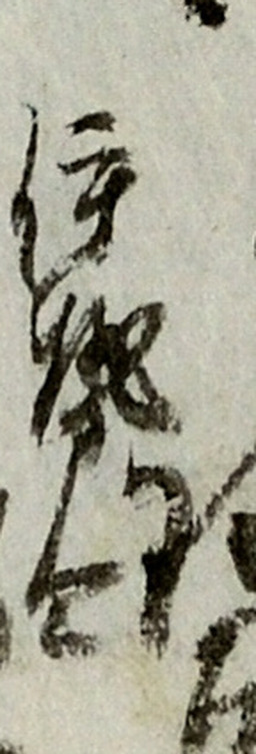伊勢屋
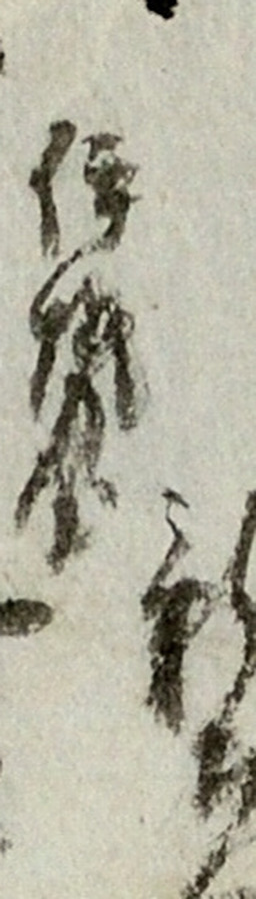伊勢屋
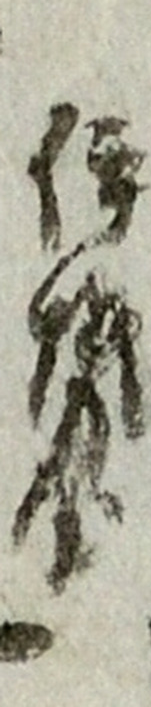伊勢屋
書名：分一方諸事御用留帳
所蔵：伊那市立高遠町図書館・合同会社AMANE
